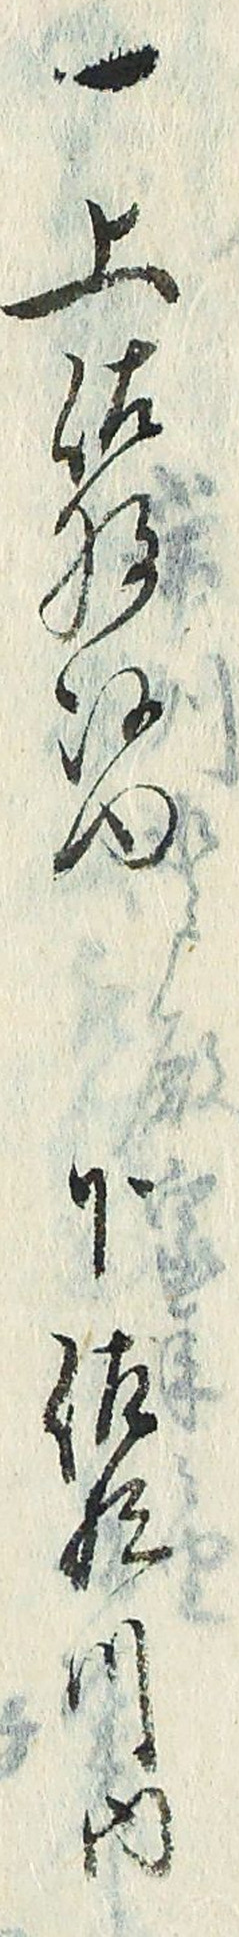一上佐那河内下佐那川内
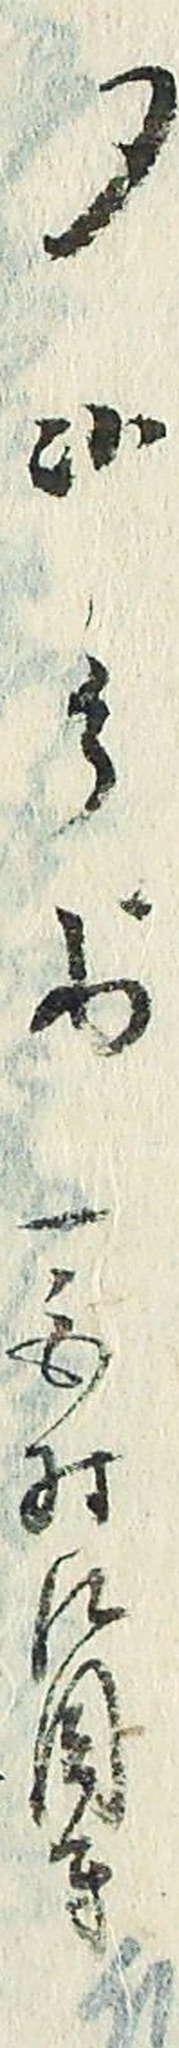〆弐ケ村一宮村郷目付
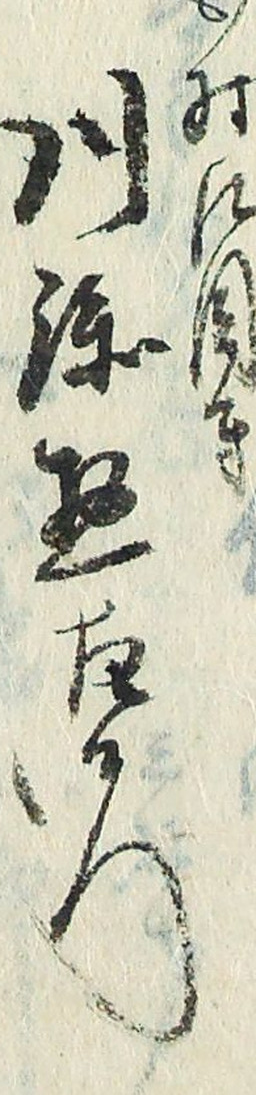川添惣左衛門
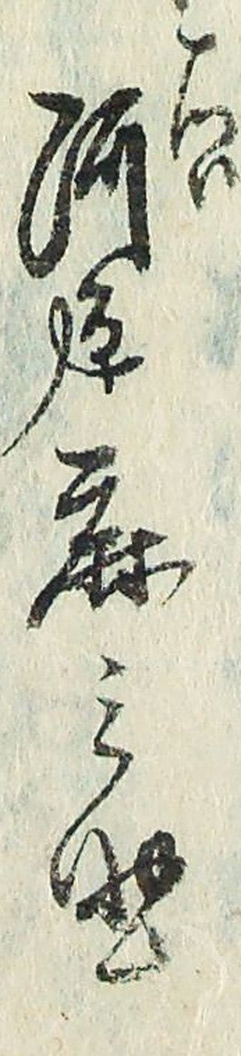河原麻之助
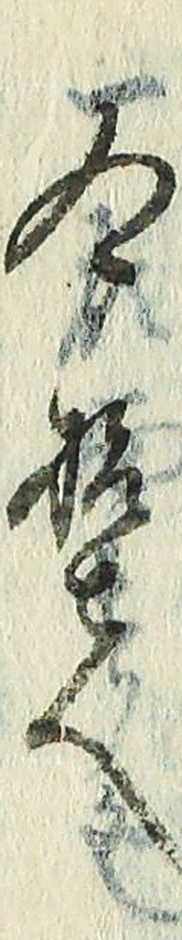合拾七人
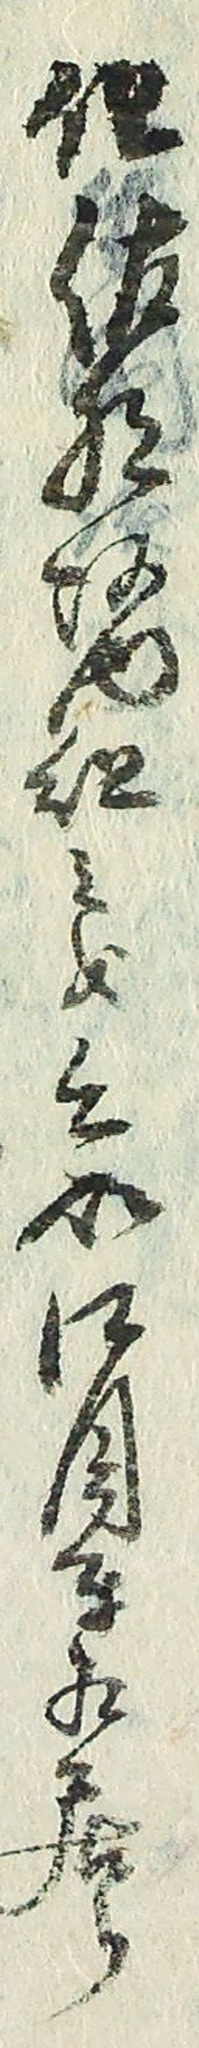但佐那河内組之義今以郷目付相居り
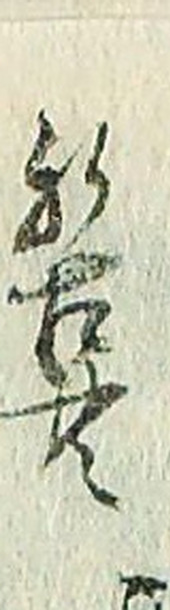新古共
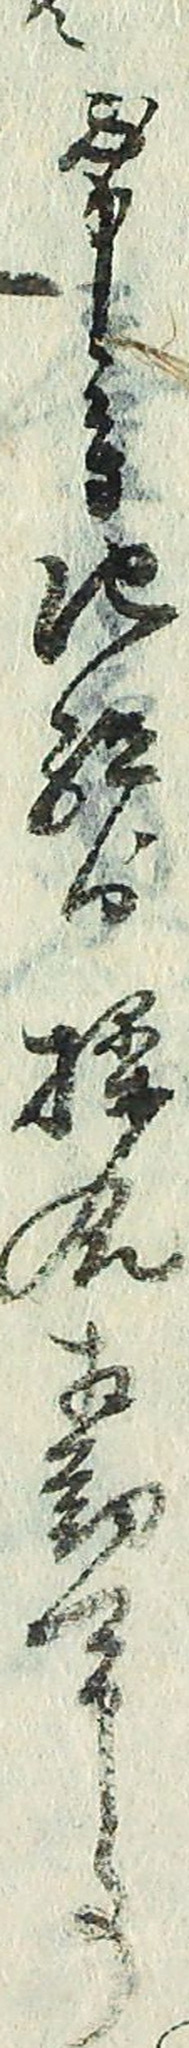不申ニ付他組ゟ繰合相勤可申事
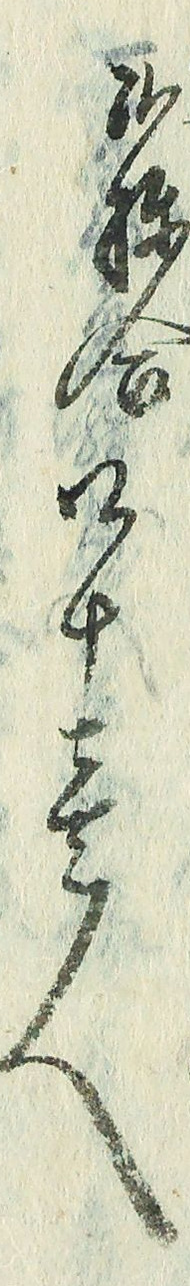弐株合四十壱人
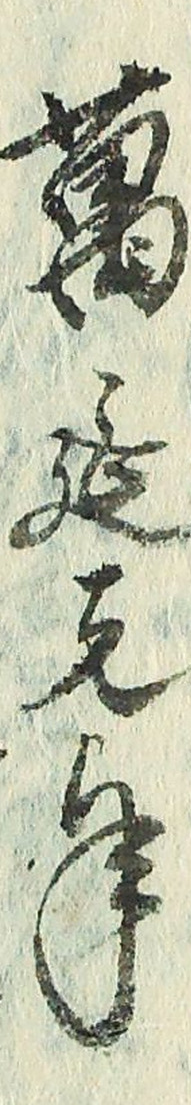萬延元年
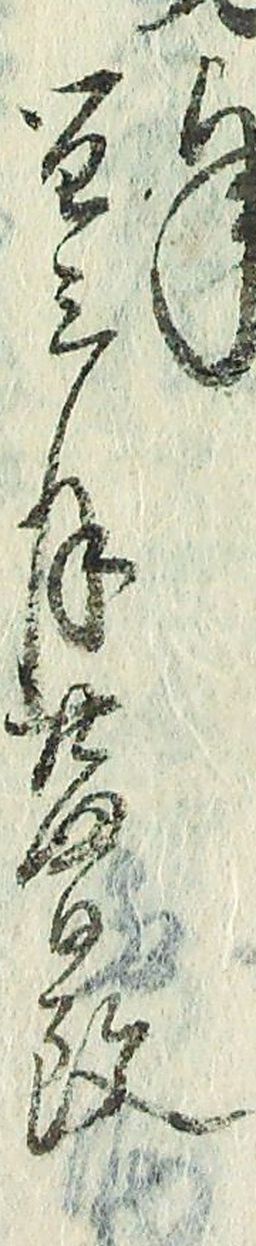閏三月廿四日改
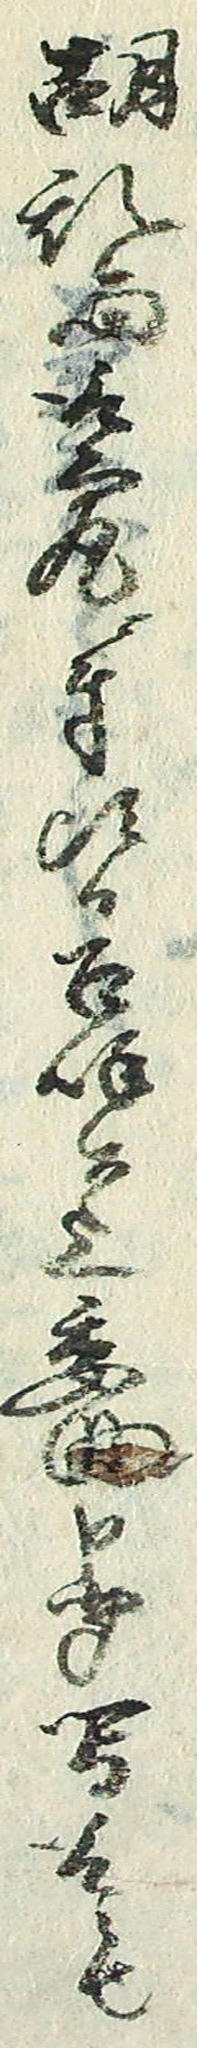胡乱者取究ニ付頃日召呼候上委曲申聞写取らせ
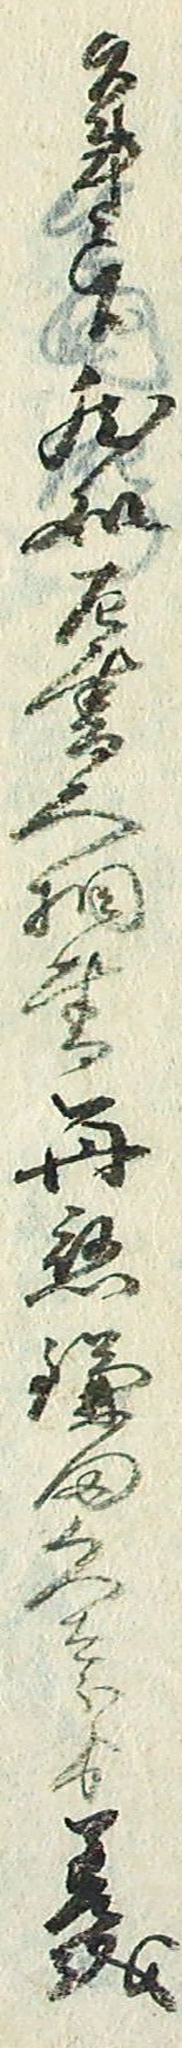候事ニ候然処左書人相書再應鎌田久太郎ゟ差越
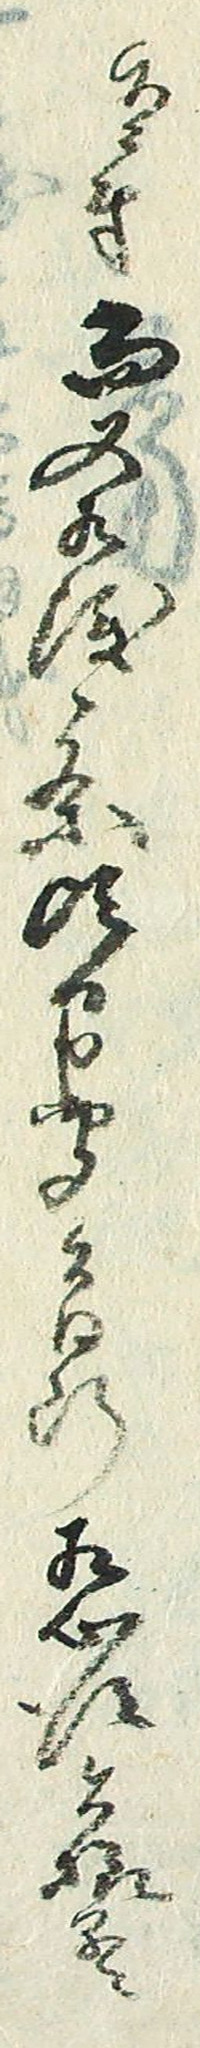候ニ付尚又相渡候条頃日申聞候同断相心得候様早々
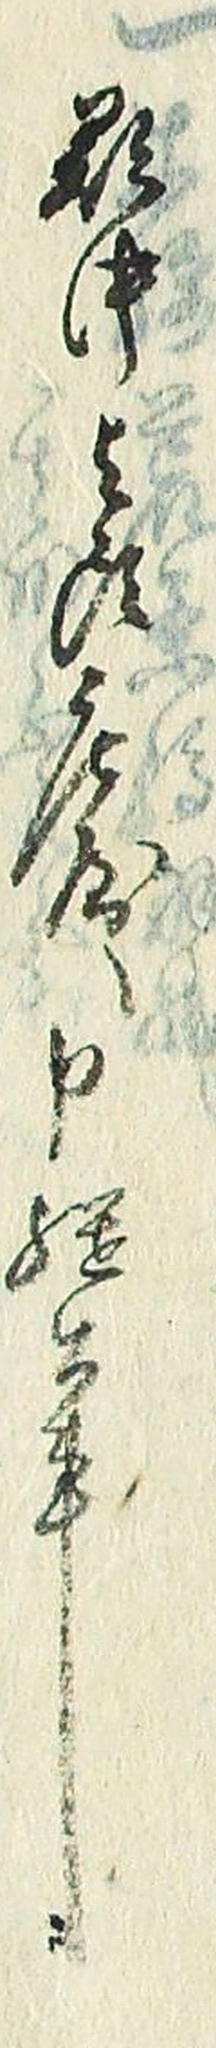郡中与頭庄屋へ申継候事
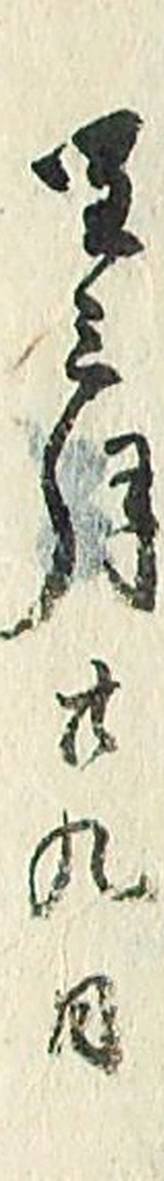閏三月廿九日
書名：諸御趣意書并御下知向之写
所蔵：鳴門教育大学 Naruto University of Education
